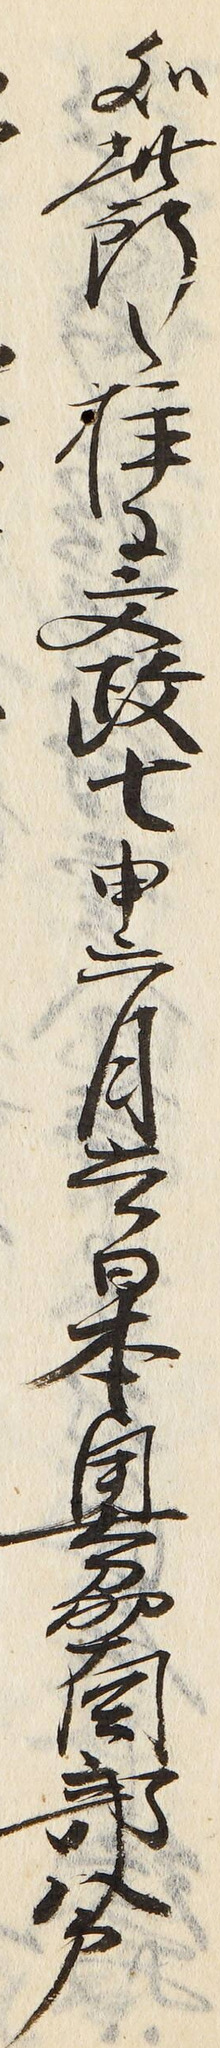処此所之柱に文政七申六月六日日本奥州南部八戸
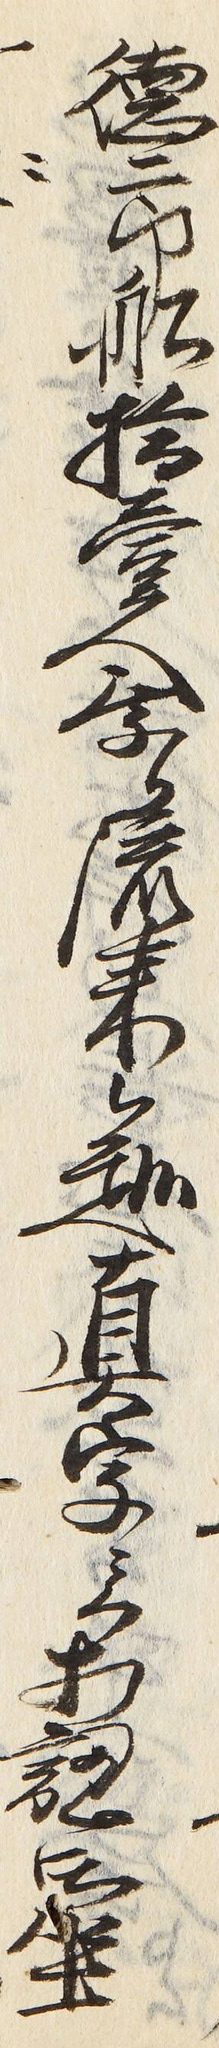徳二郎船拾壱人乗り流来候趣真字にて相認御坐候
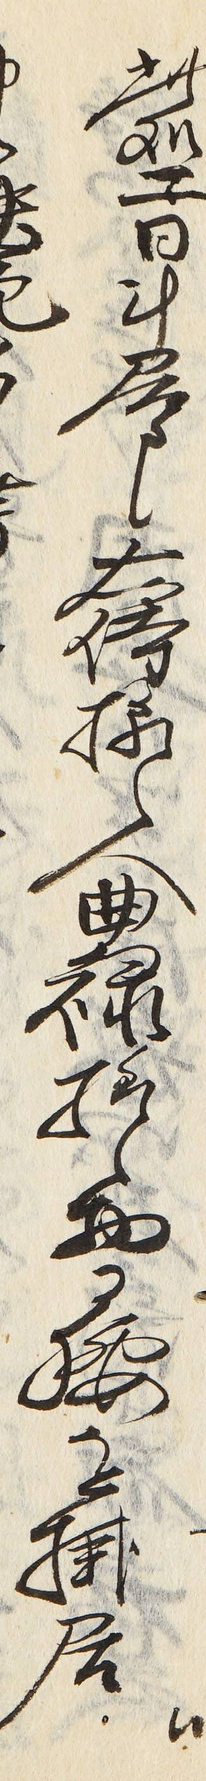此処に二日斗居申候右侍様之人曲禄様之物に腰を掛居
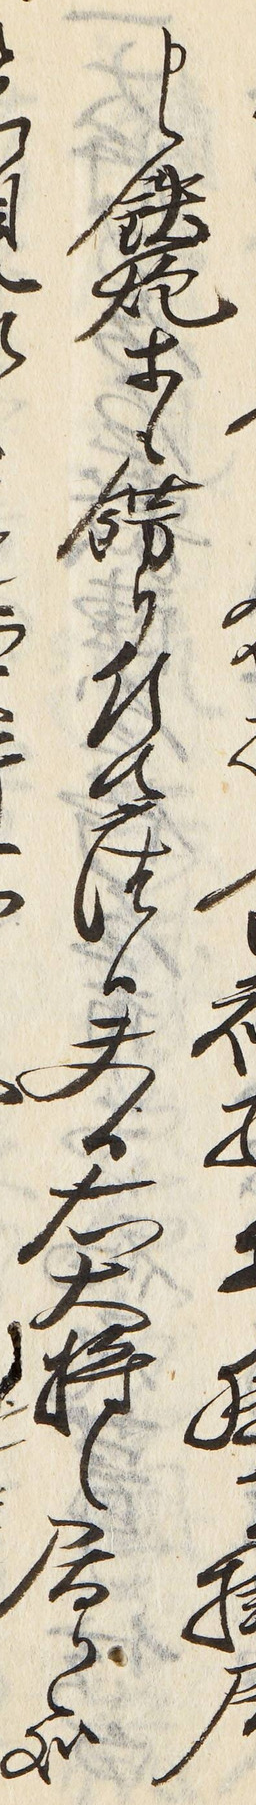申候鉄炮等も餝り付御座候夫ゟ右大将之居り候処
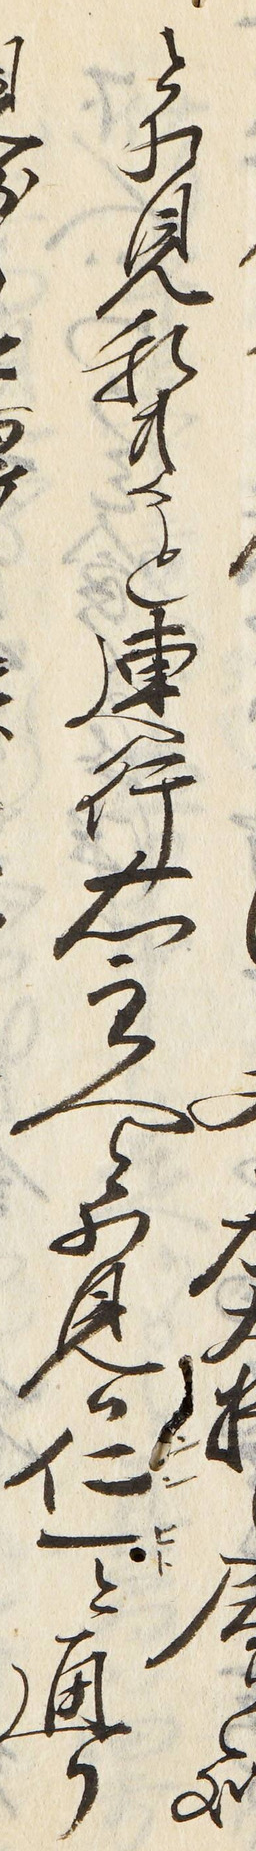と相見私共を連行右主人と相見候仁一と通り
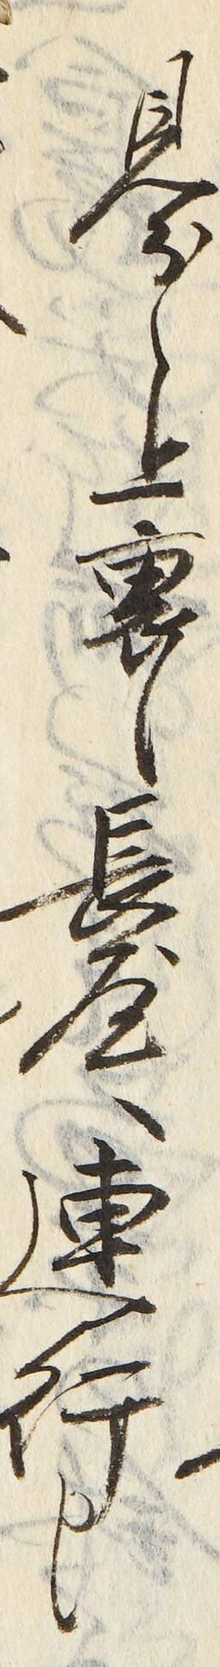見分之上裏之長屋へ連行申候
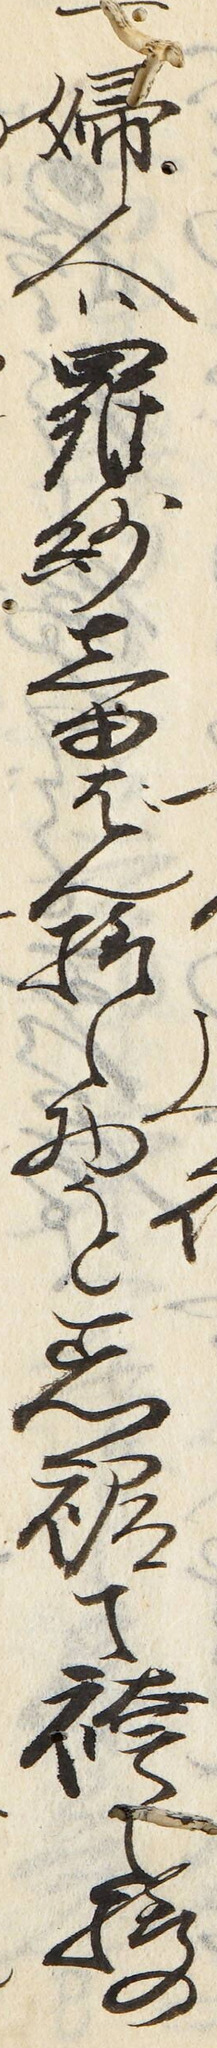一婦人は羅紗しゆばん様之物を着裾は袴之様の
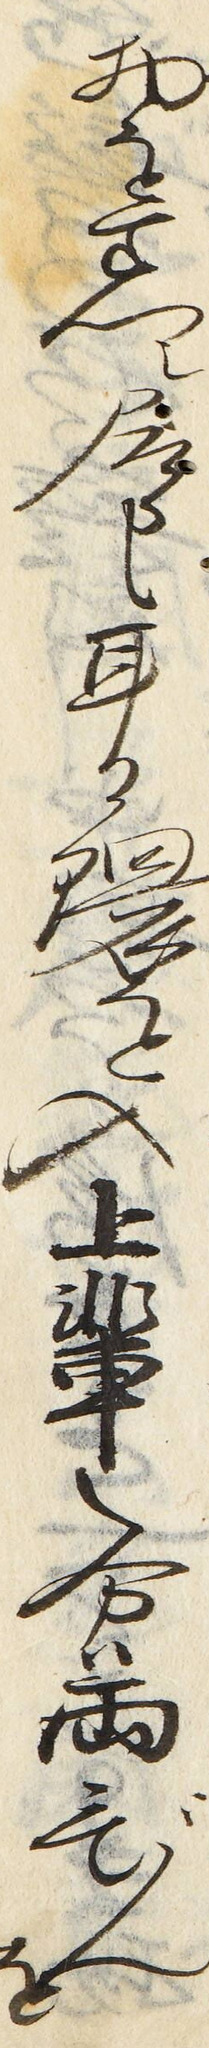物を着し居申候耳に環を入上輩之分は両びんを

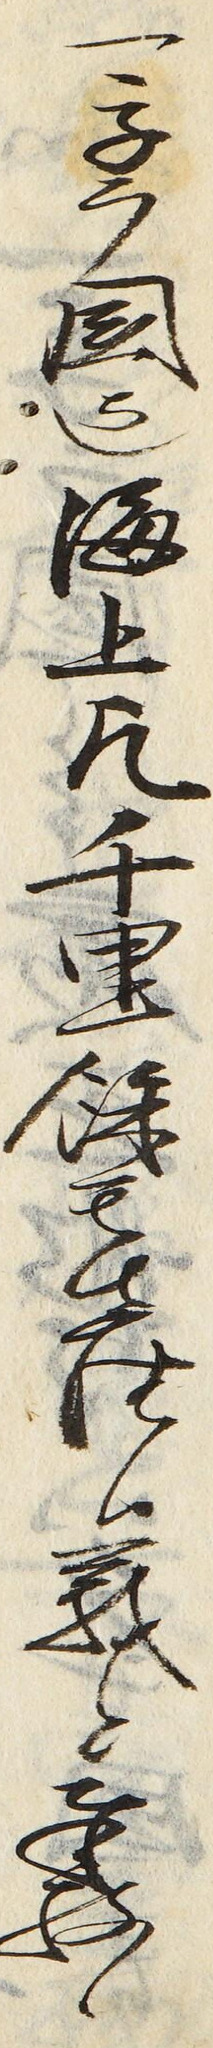マネラ国迄海上凡そ千里余も御座候義と奉存候
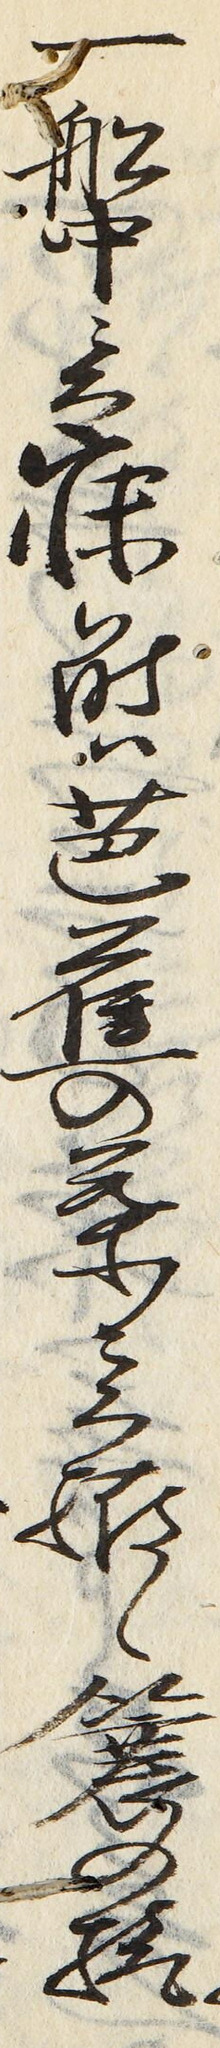一船中ニ而寐候時は芭蕉の葉ニ而拵候蓑の様
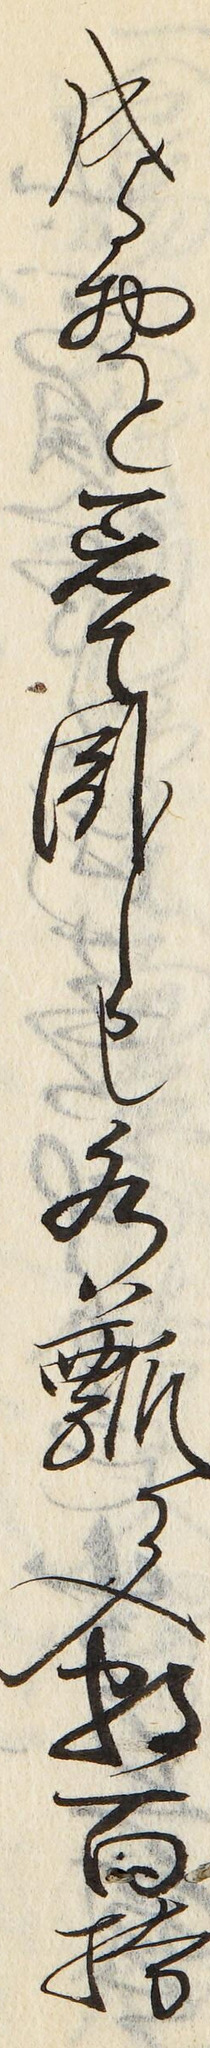成る物を着て臥し申候水ハ瓢ニ入数百持
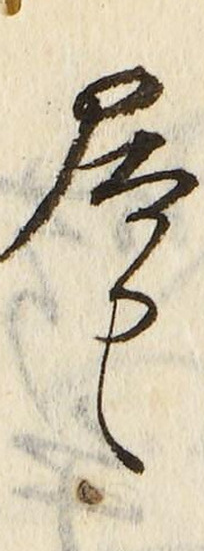居申候
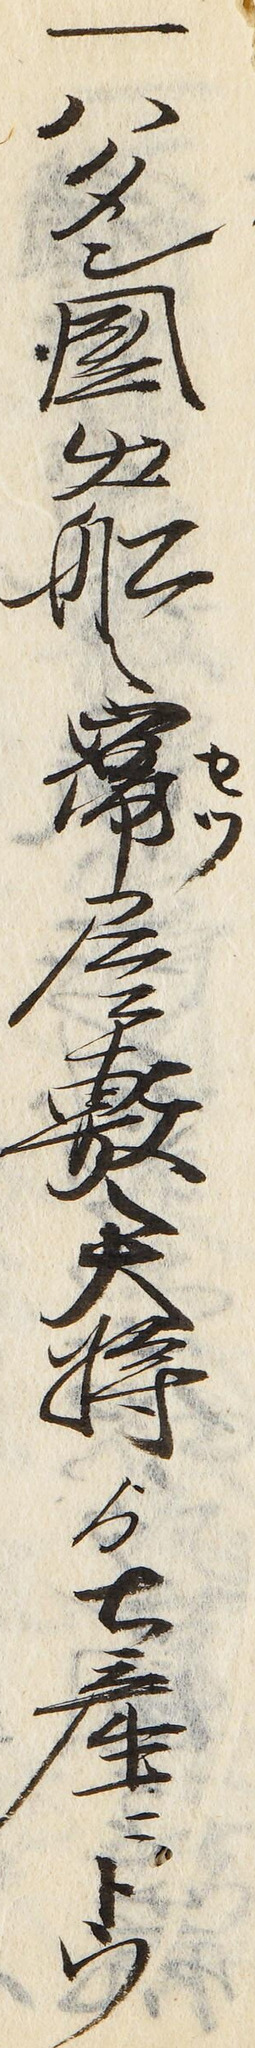一ハタン国出船之節屋敷之大症ゟ土産ニトウ
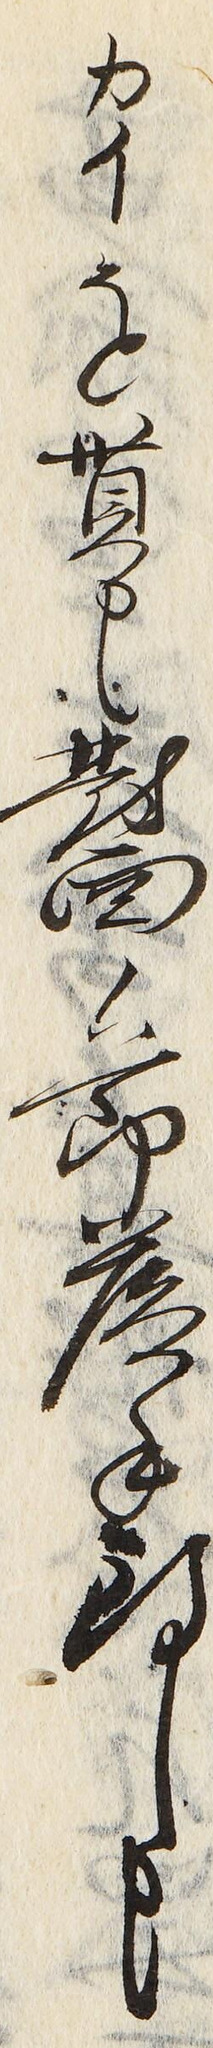カイを貰申候対面ノ節落手致し申候
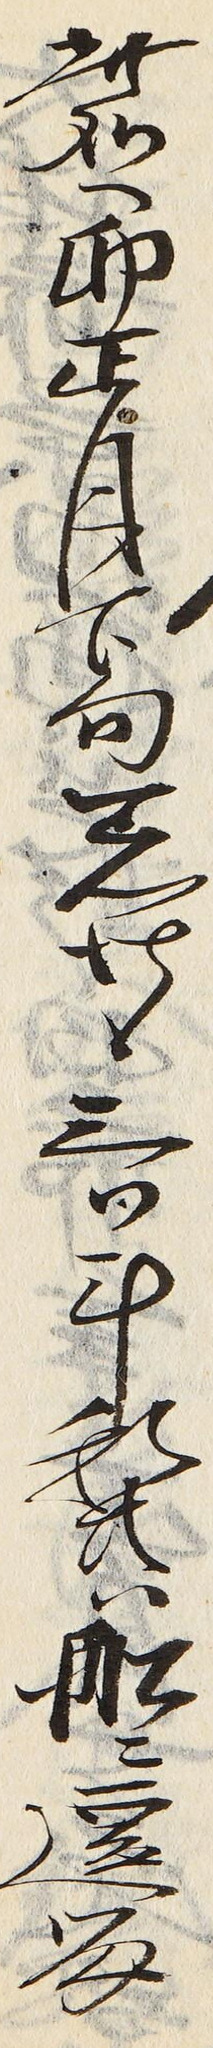此処へ卯正月下旬着地候三日計私共は船ニ逗留
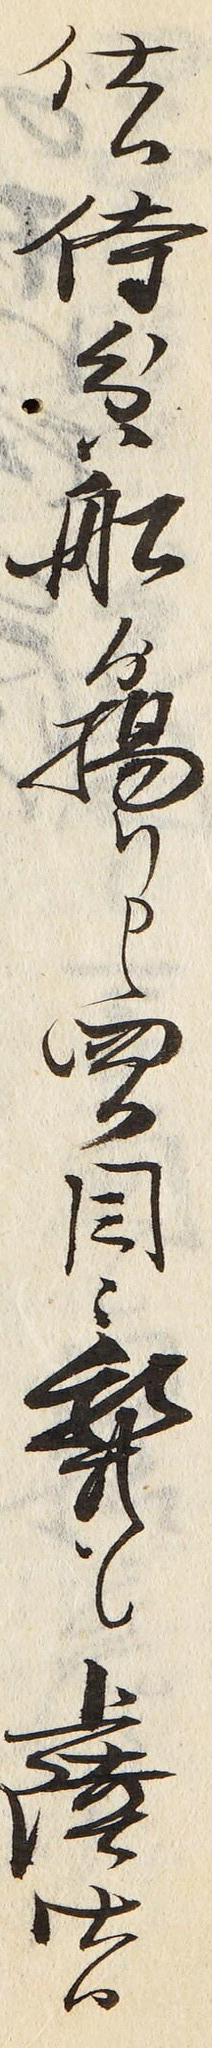仕候侍分は船ゟ揚り申候四日目に私共も上陸仕候
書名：漂流記
